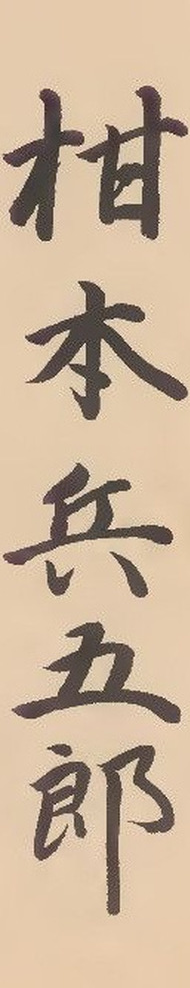柑本兵五郎
